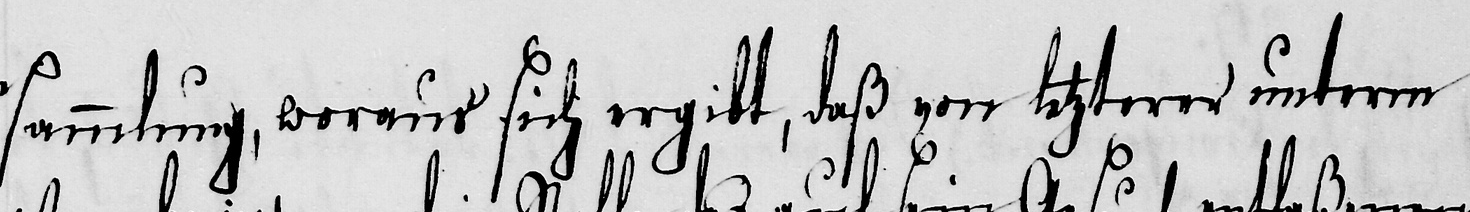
sammlung, woraus sich ergibt, daß von letzterer unterm
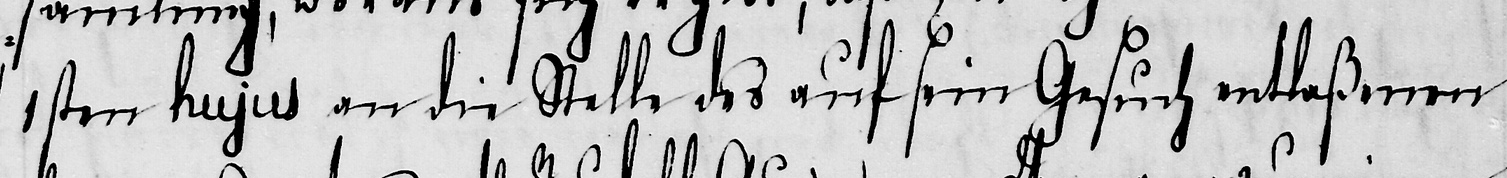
1sten hujus an die Stelle des auf sein Gesuch entlaßenen
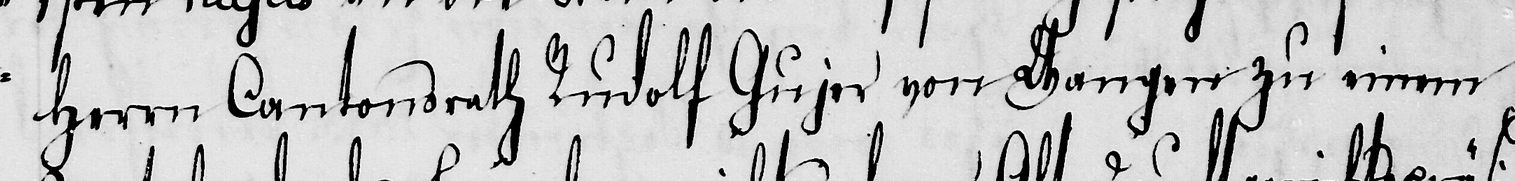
Herrn Cantonsrath Rudolf Gujer von Wangen zu einem
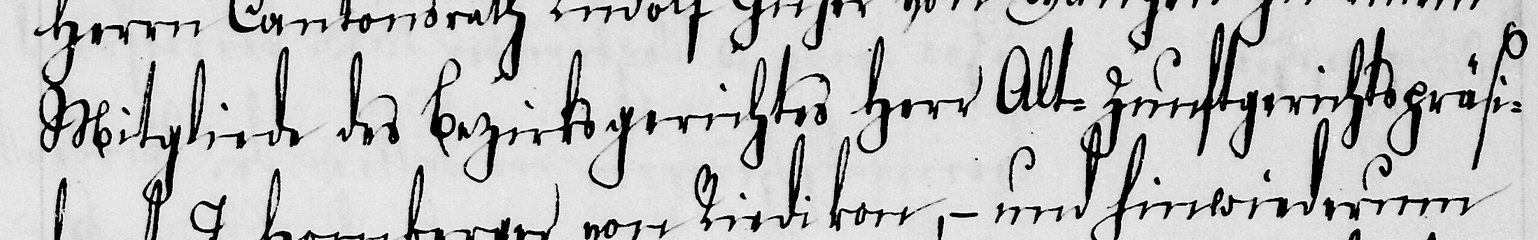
Mitgliede des Bezirksgerichtes Herr Alt-Zunftgerichtspräs¬
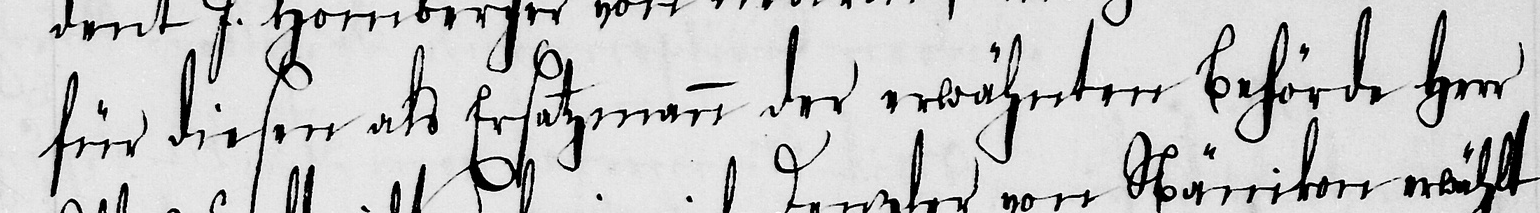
für diesen als Ersatzmann der erwähnten Behörde Herr
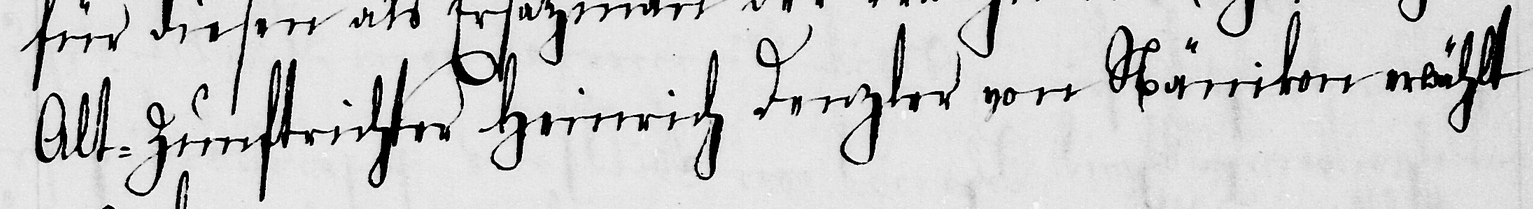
Alt-Zunftrichter Heinrich Denzler von Nänikon erwählt
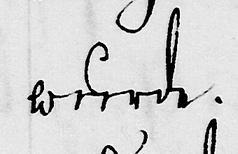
wurde.
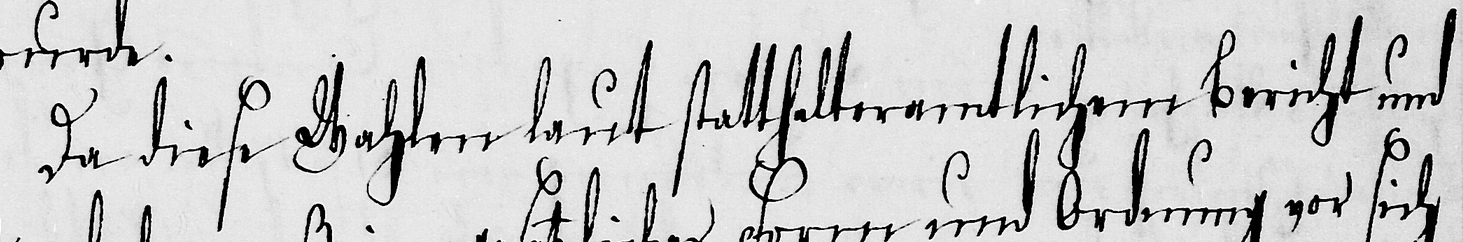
Da diese Wahlen laut statthalteramtlichen Bericht und
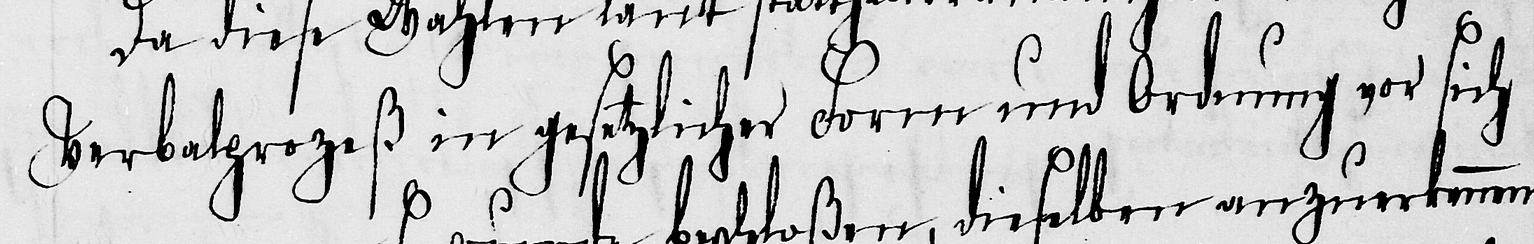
Verbalprozeß in gesetzlicher Form und Ordnung vor sich
